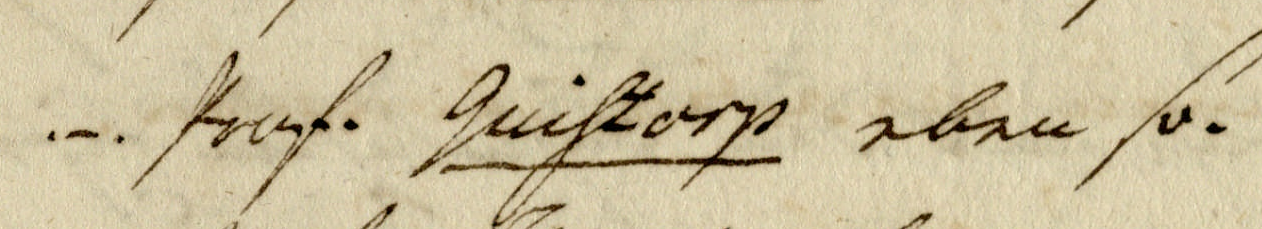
Prof. Quistorp eben so.
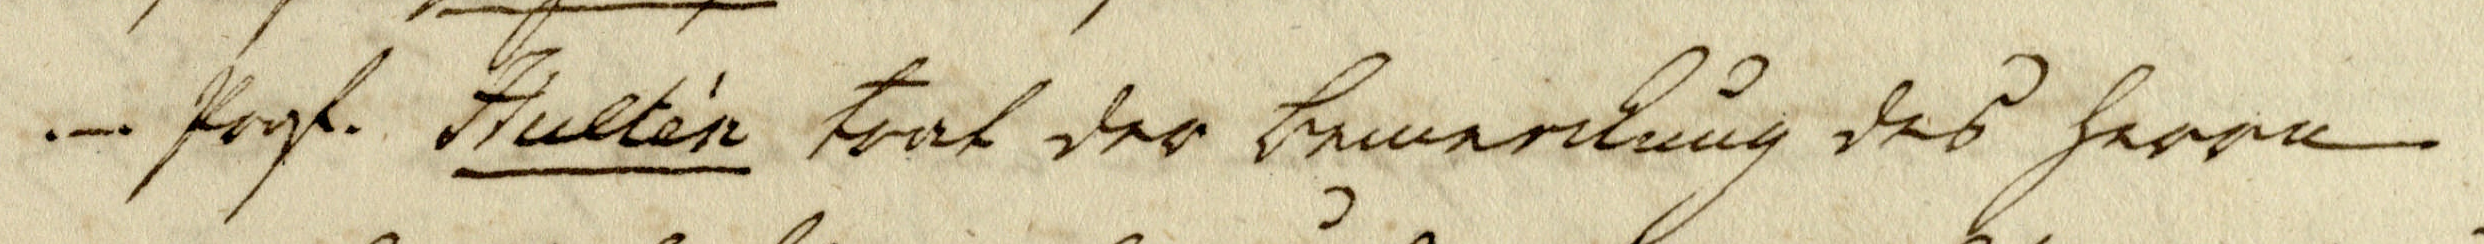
Prof. Hultén trat der Bemerckung des Herrn
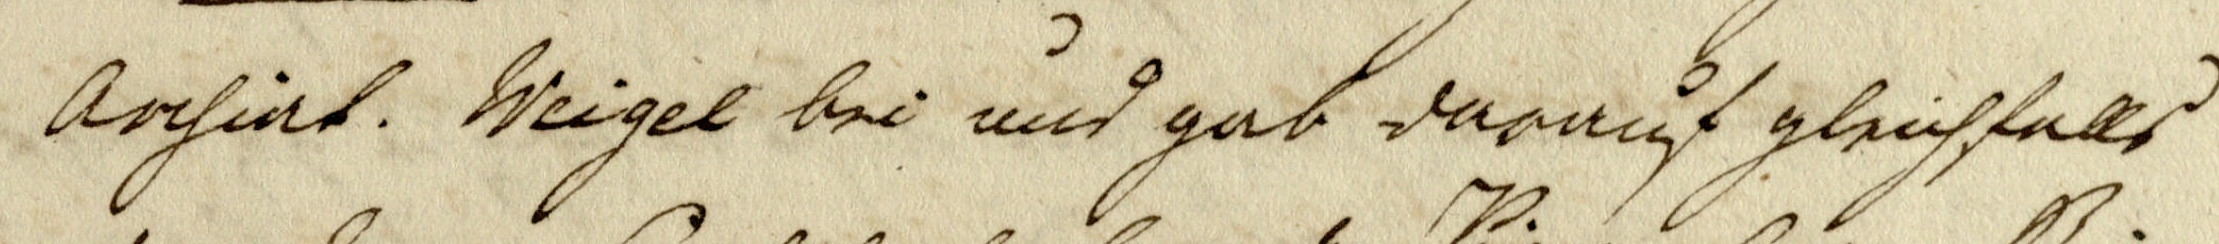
Archiat. Weigel bei und gab darauf gleichfalls
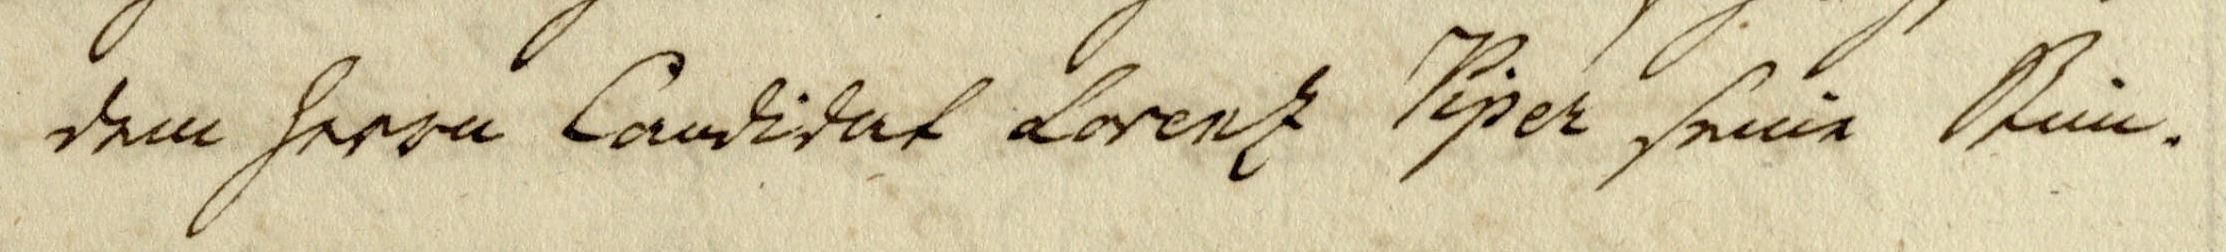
dem Herrn Candidat Lorenz Piper seine Stim¬
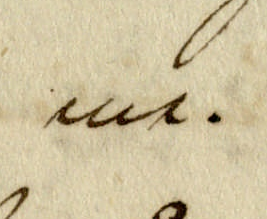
me.
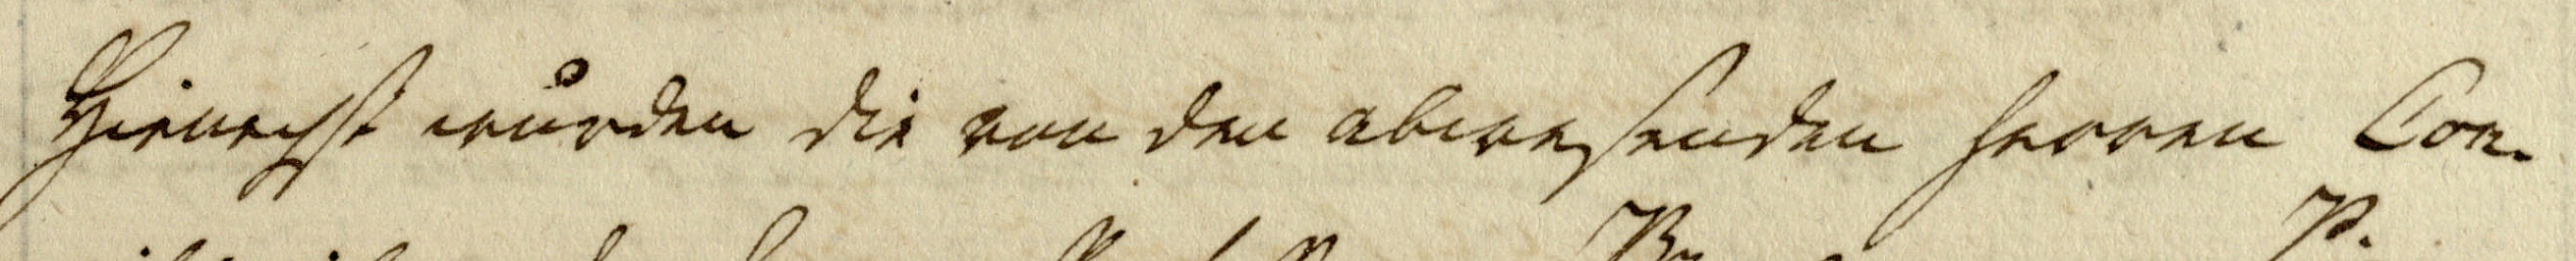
Hienechst wurden die von den abwesenden Herren Con¬
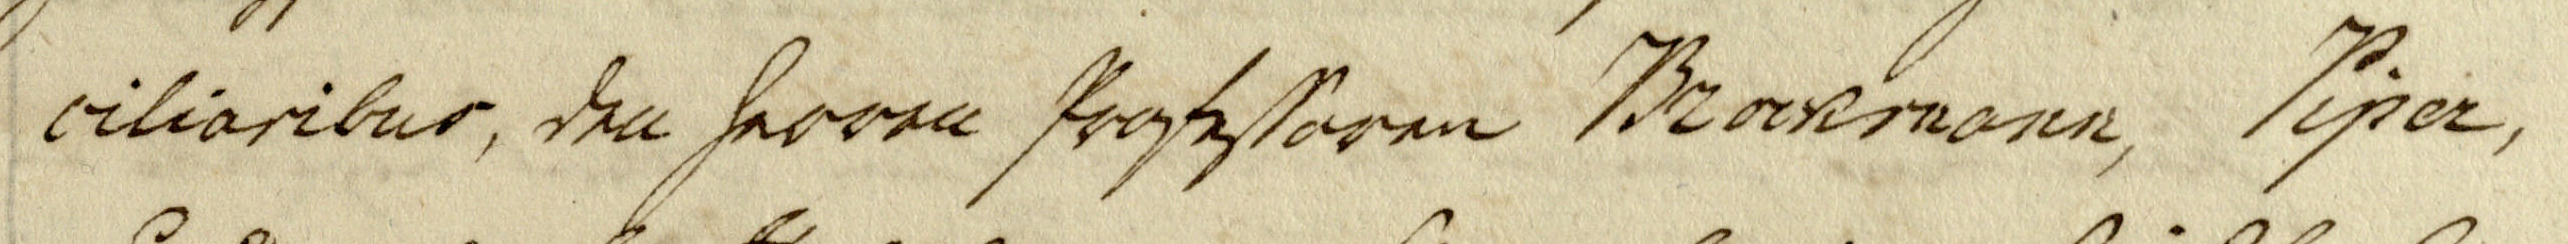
ciliaribus, den Herren Professoren Brockmann, Piper,
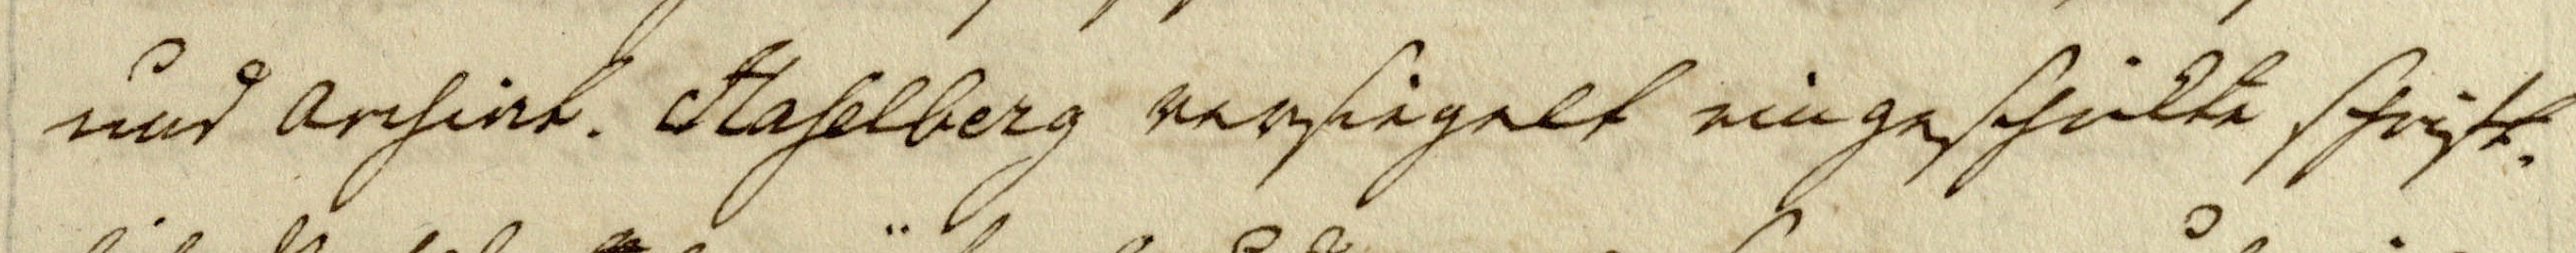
und Archiat. Haselberg versiegelt eingeschickte schrift¬
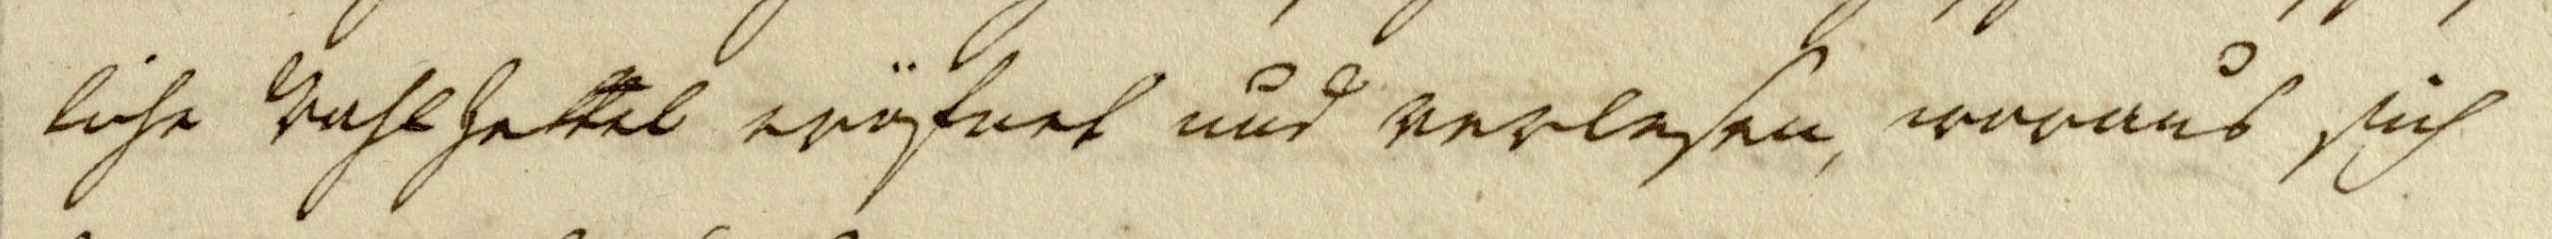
liche Wahl Zettel eröfnet und verlesen, woraus sich
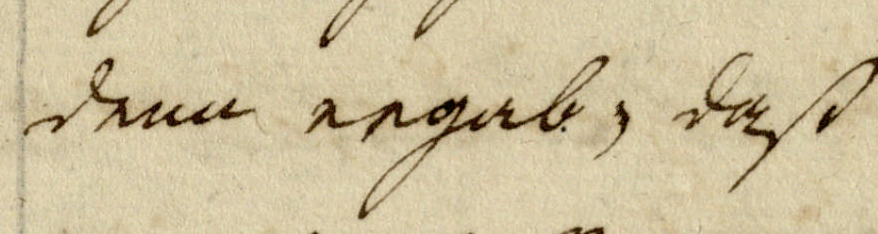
denn ergab; daß
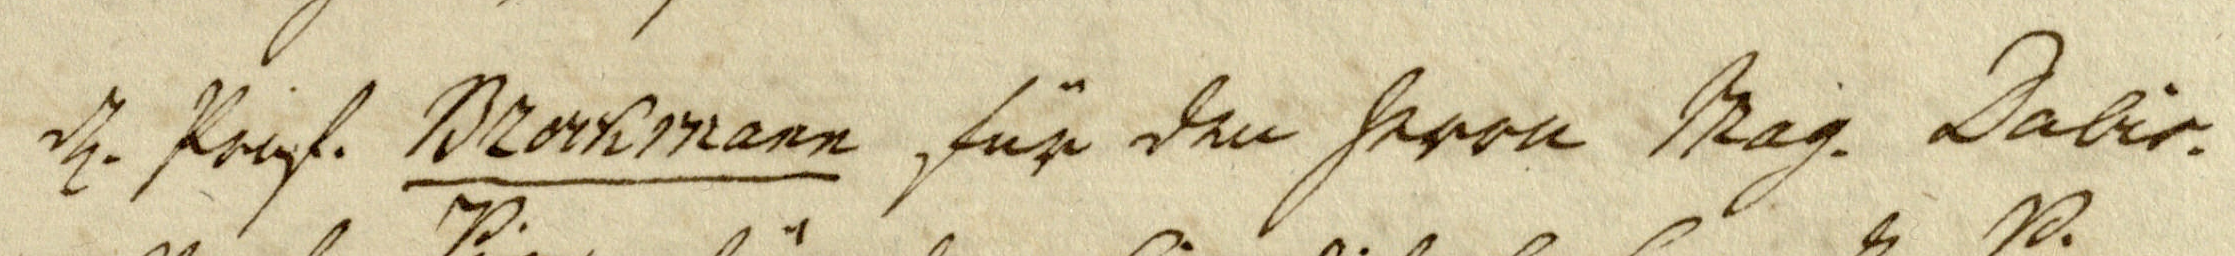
dh. Prof. Brockmann für den Herrn Mag. Dabis.
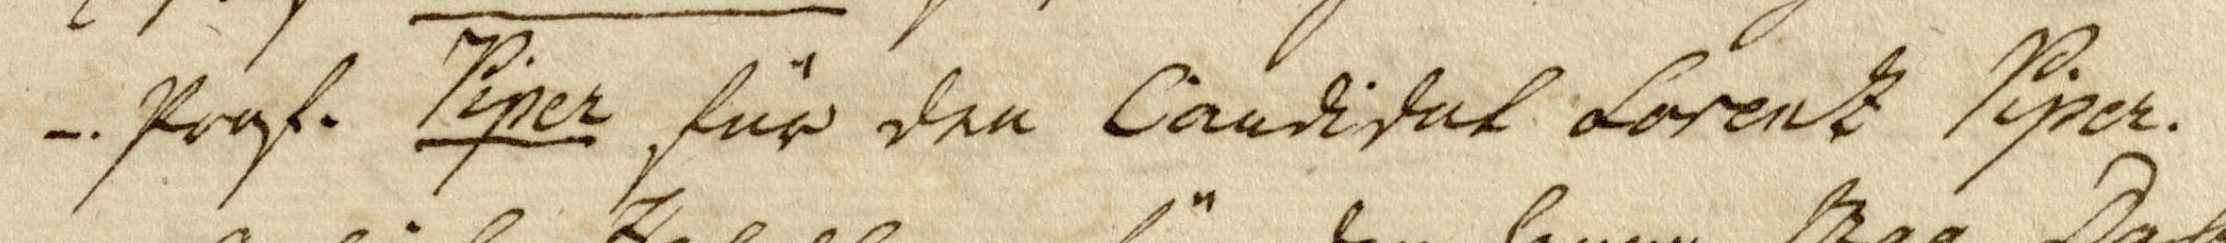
Prof. Piper für den Candidat Lorenz Piper.
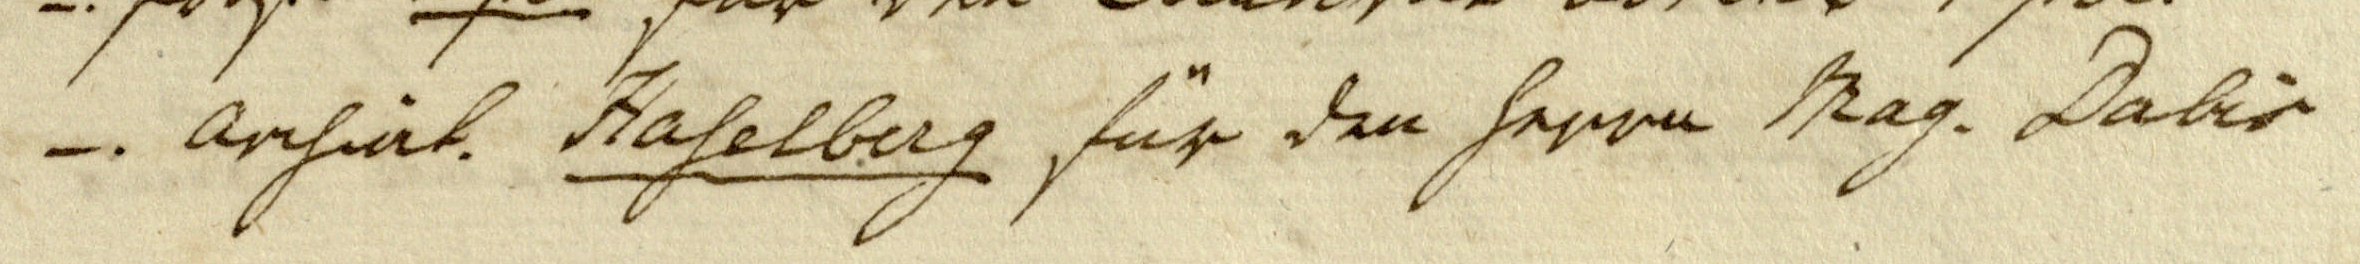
Archiat. Haselberg für den Herrn Mag. Dabis
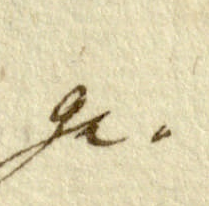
ge¬
